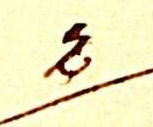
2
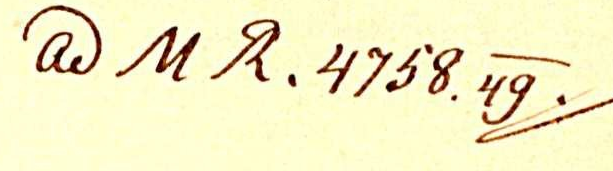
ad M R. 4758. 49.
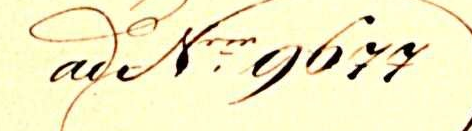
ad Nr. 9677
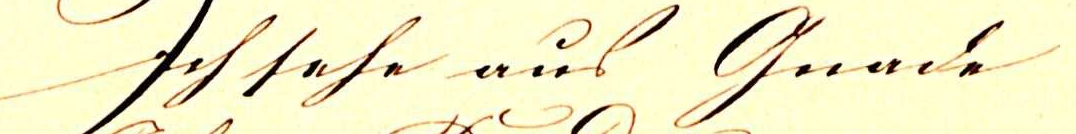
Ich sehe aus Gnade
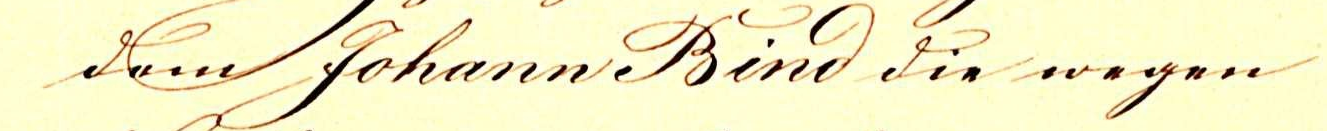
dem Johann Bind die wegen
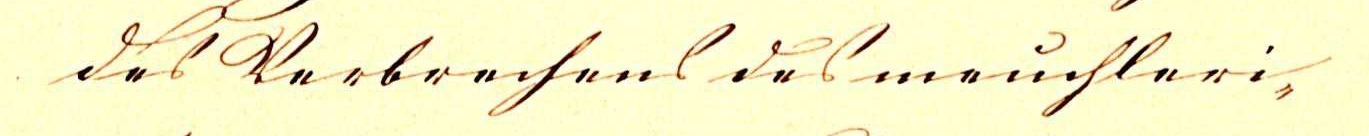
des Verbrechens des meuchleri¬
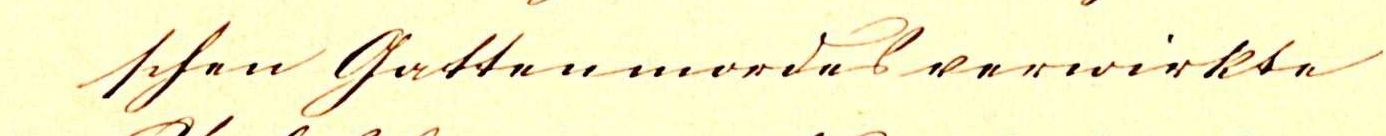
schen Gattenmordes verwirkte
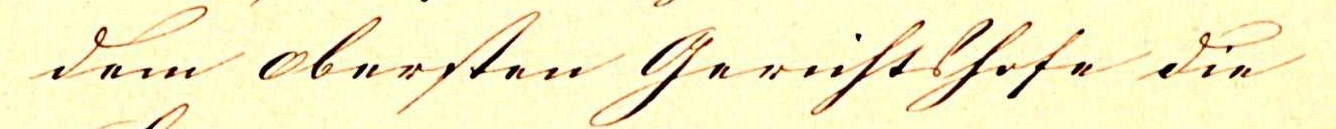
dem obersten Gerichtshofe die
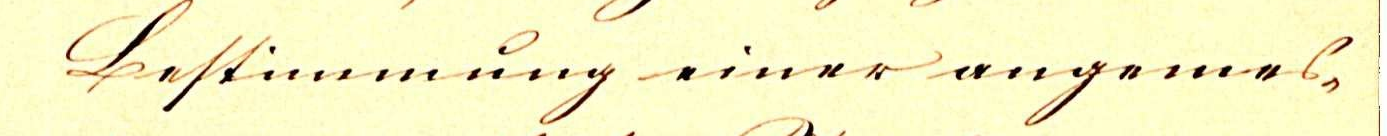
Bestimmung einer angemes¬
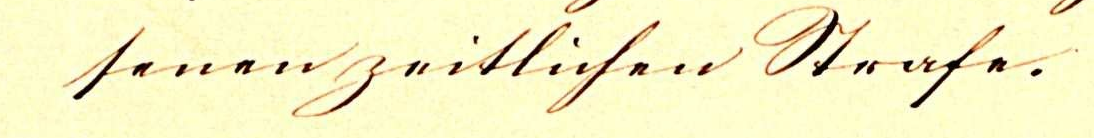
Schmerling
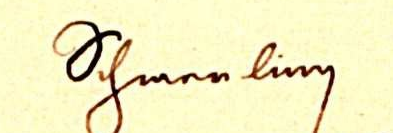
senen zeitlichen Strafe.
